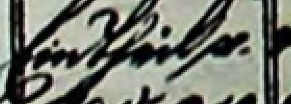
Ein Theil v.
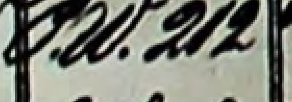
P.W. 212
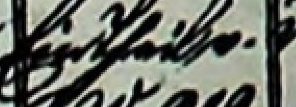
Ein Theil v.
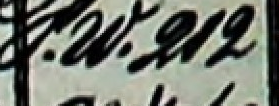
P.W. 22
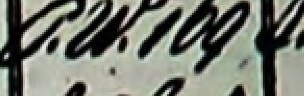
P.W. 169
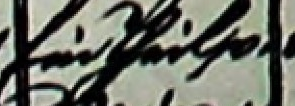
Ein Theil v.
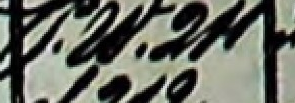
P.W. 211
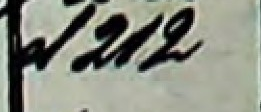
d 212
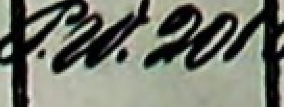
P.W. 201
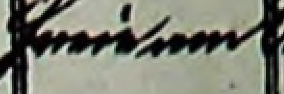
Svein am
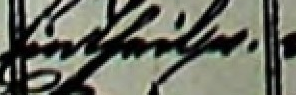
Ein Theil v.
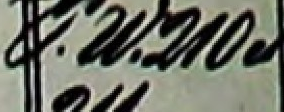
P.W. 210 d
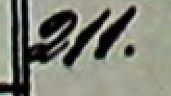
211.
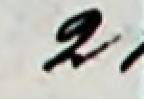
2
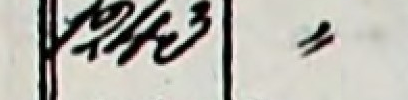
1243 „
